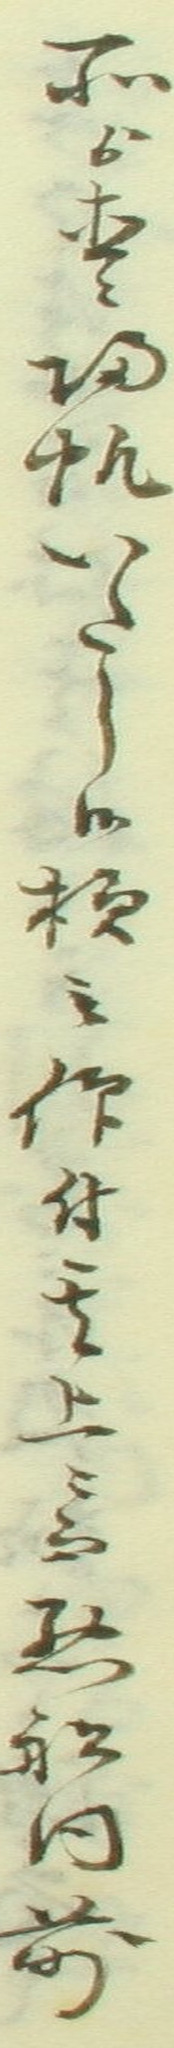所ゟ直に帰帆いたし候様被仰付其上に而悪船同前
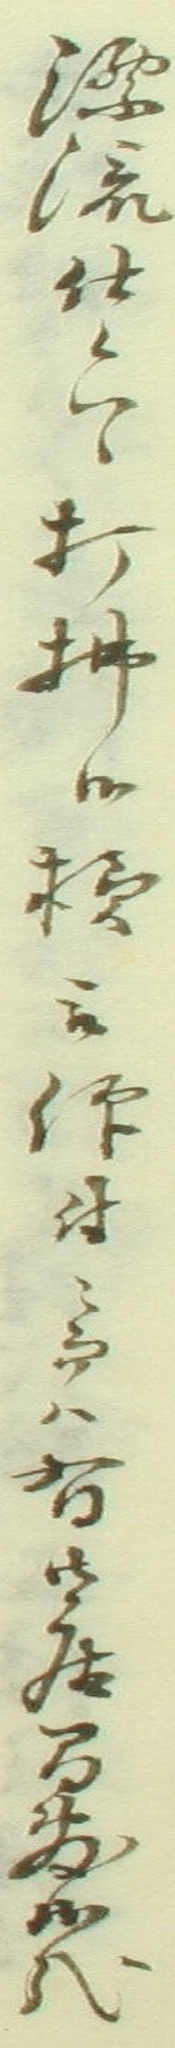漂流仕候はゝ打払候様被仰付に而は有御座間敷候哉
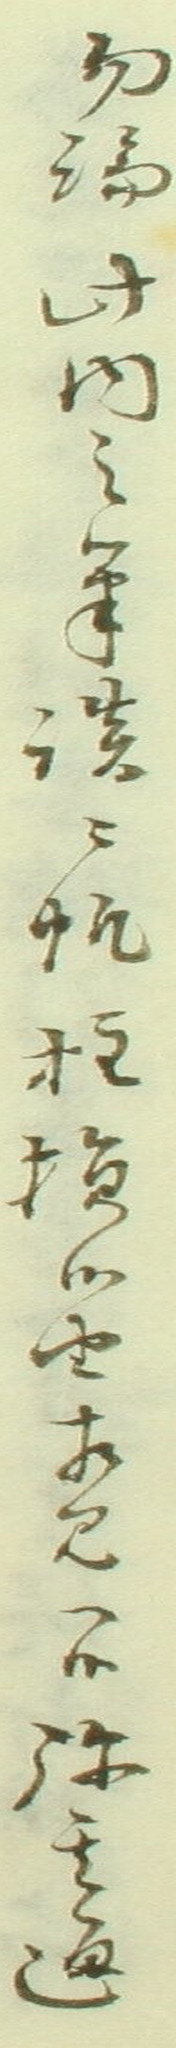勿論此内之筆談に帆柱損候由相見へ候弥其通
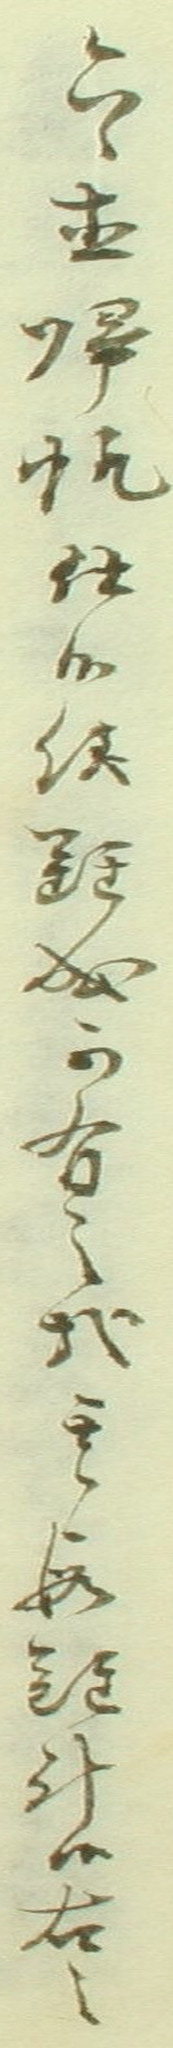候はゝ直帰帆仕候供難成可有之哉其段難計候右之
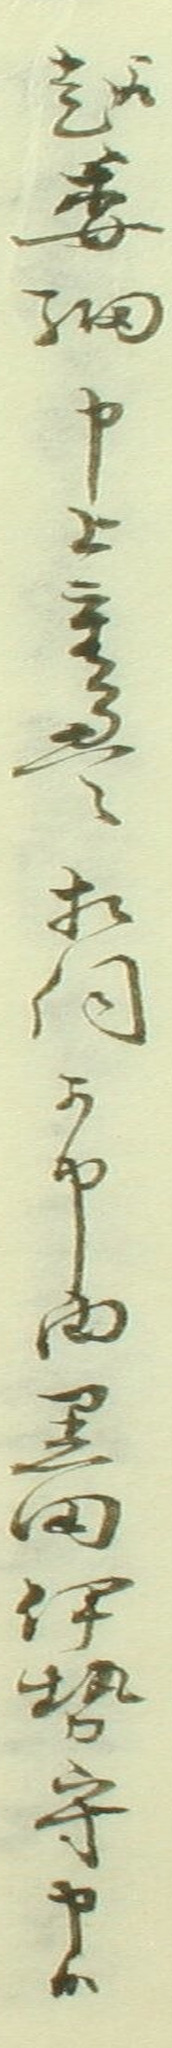趣委細申上重畳相伺可申由黒田伊勢守申候
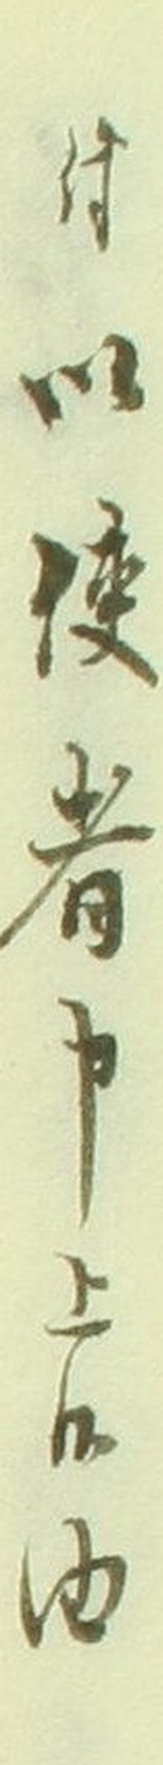付御使者申上候由
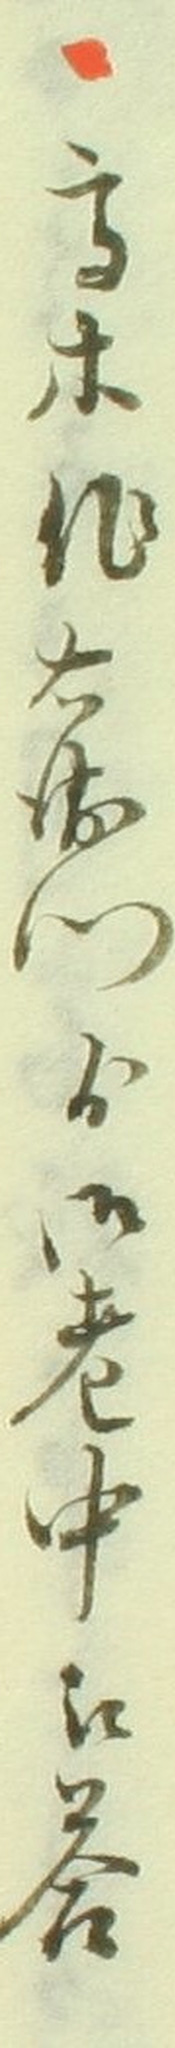高木作右衛門ゟ御老中え答
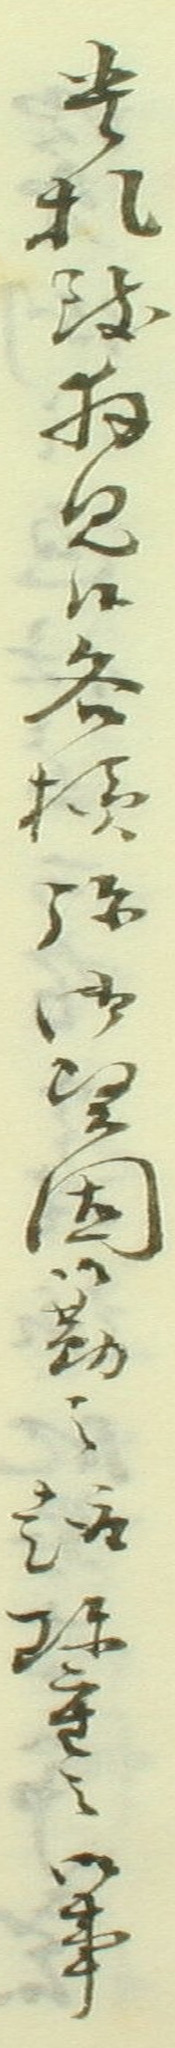貴札致拝見候各様弥御堅固御勤之趣珍重之御事
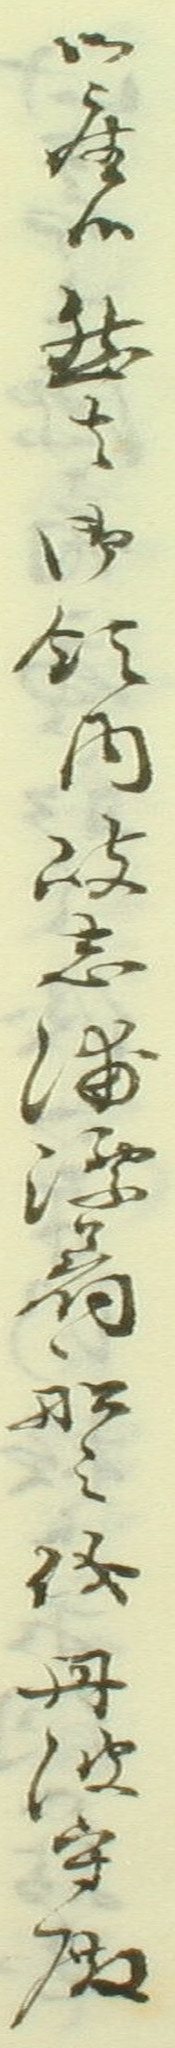御座候然者御領内岐志浦漂着候船之儀丹波守殿
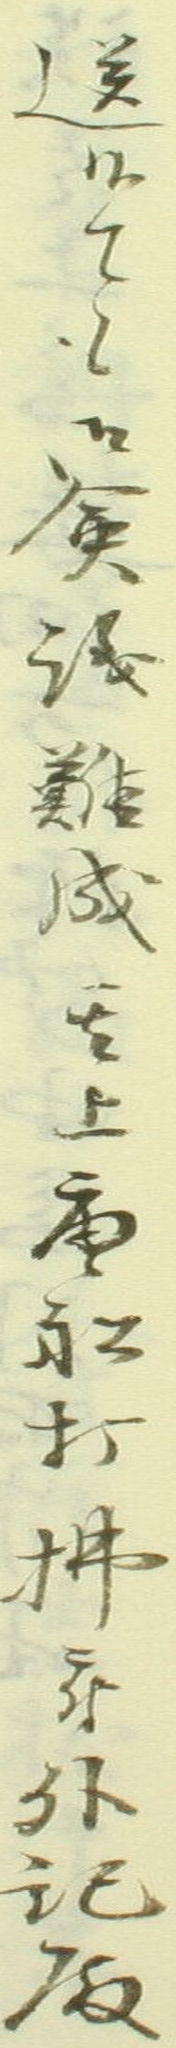送候ても御僉議難成其上唐船打払に付外記殿
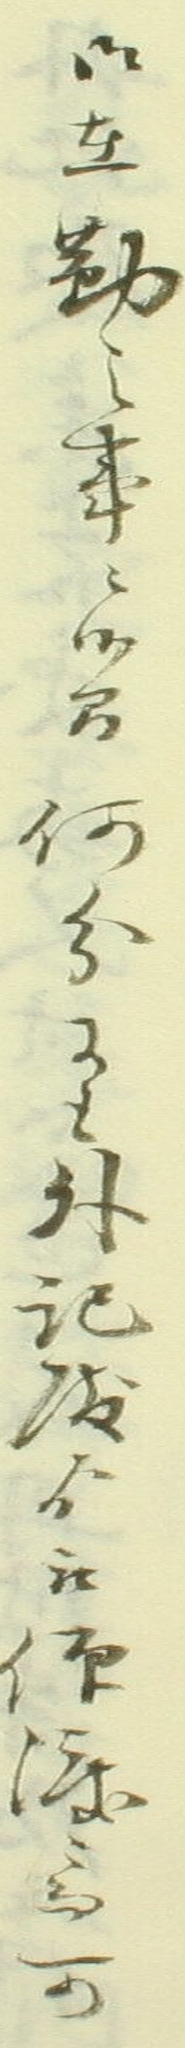御在勤之事に候間何分にも外記殿ゟ被仰渡に而可
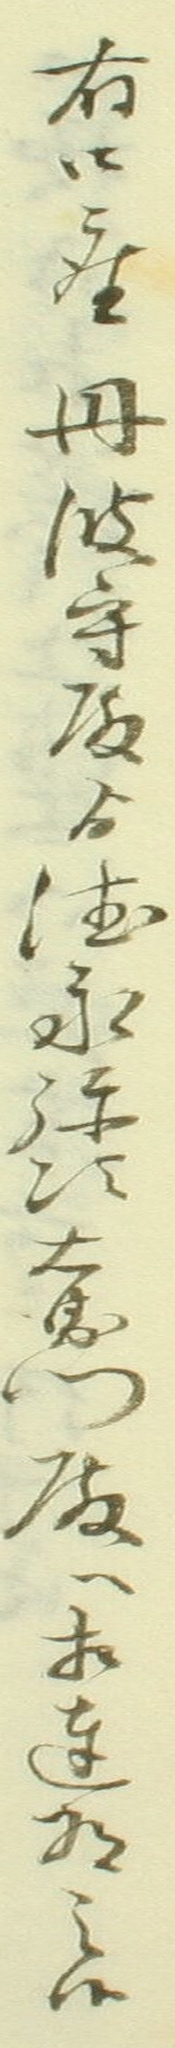有御座丹波守殿ゟ徳永弥次右衛門殿へ相達有之候
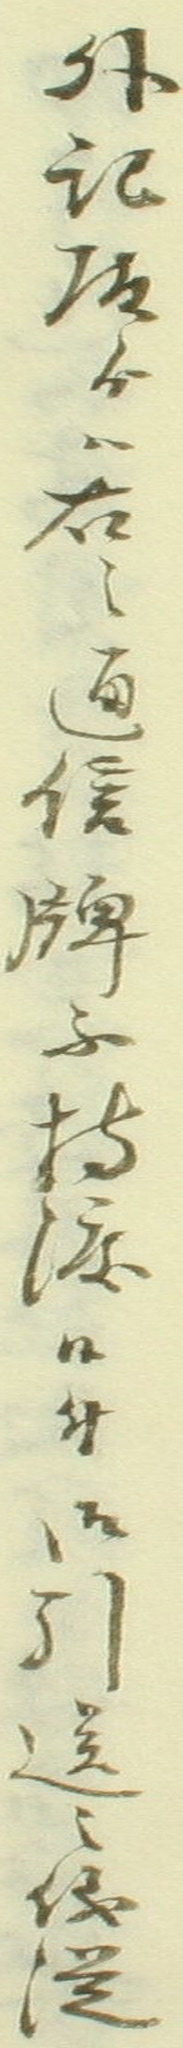外記殿ゟは右之通信牌不持渡候付御引送之儀従
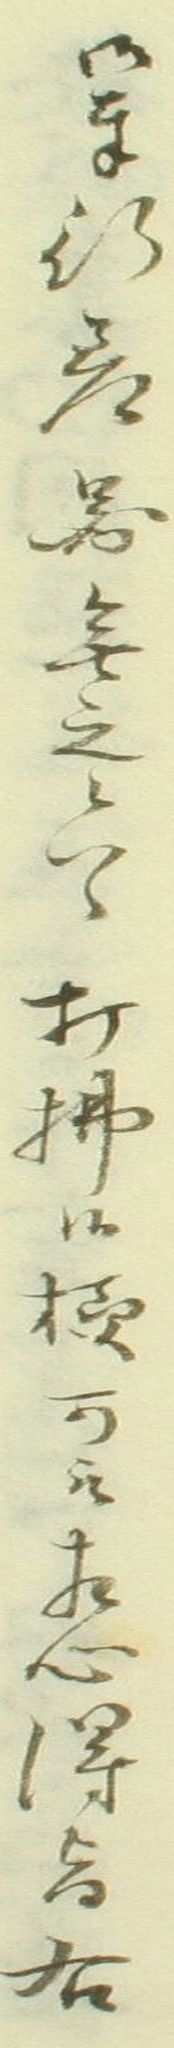御奉行差図無之候はゝ打払候様可被相心得旨右
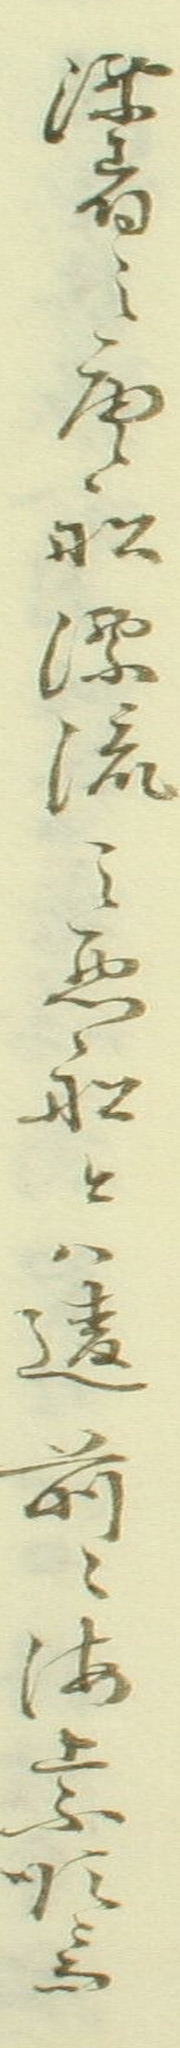漂着之唐船漂流之悪船とは違前々海上不順に而
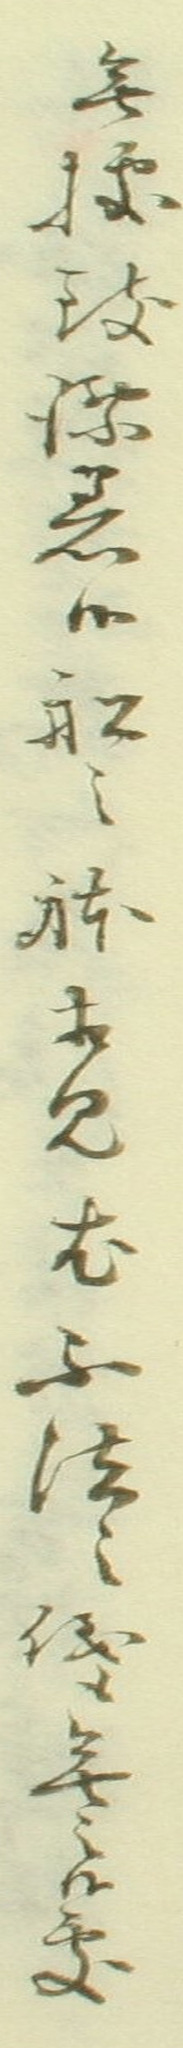無拠致漂着候船之躰相見尤不法之儀も無之候処
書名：異国船漂着記
